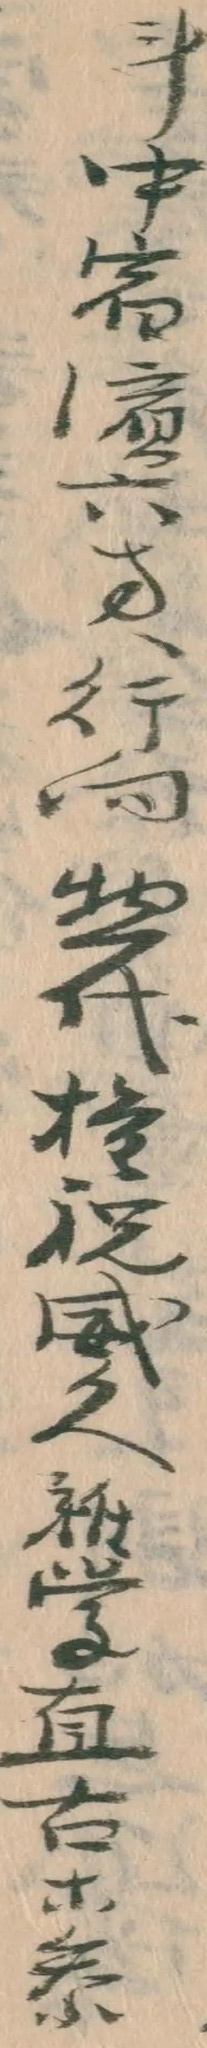計中宿濱六方へ行向惣代権祝威久雑掌直古等参
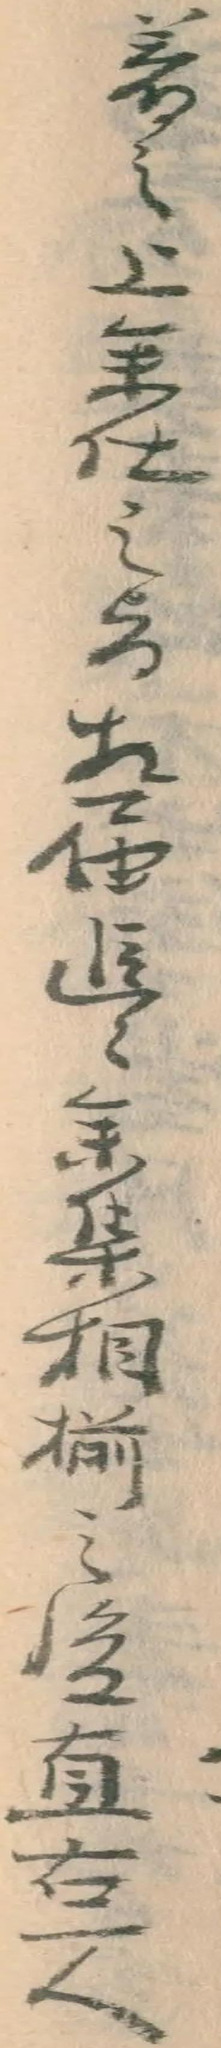着之上参仕之旨相届追々参集相揃之後直古一人
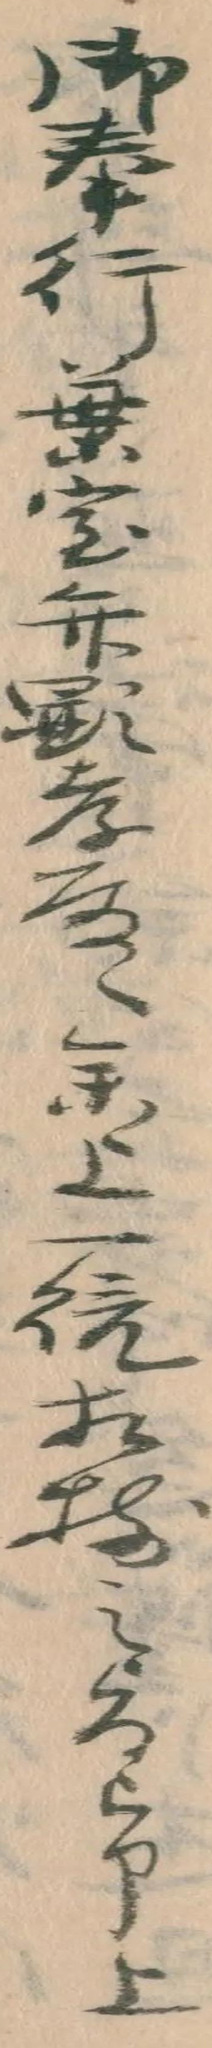御奉行葉室弁顕孝殿へ参上一統相揃之旨被申上
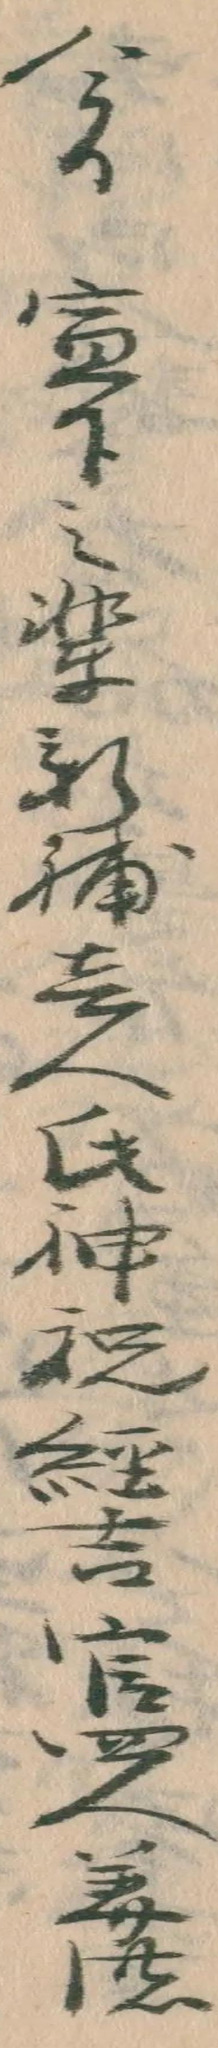今日宣下之輩新補壱人氏神祝経吉官四人美濃
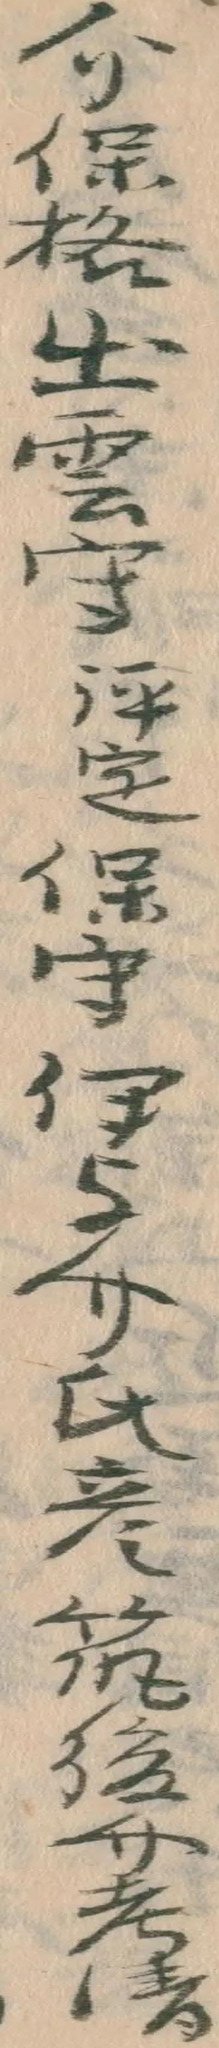介保格出雲守評定保守伊与介氏彦筑後介考清
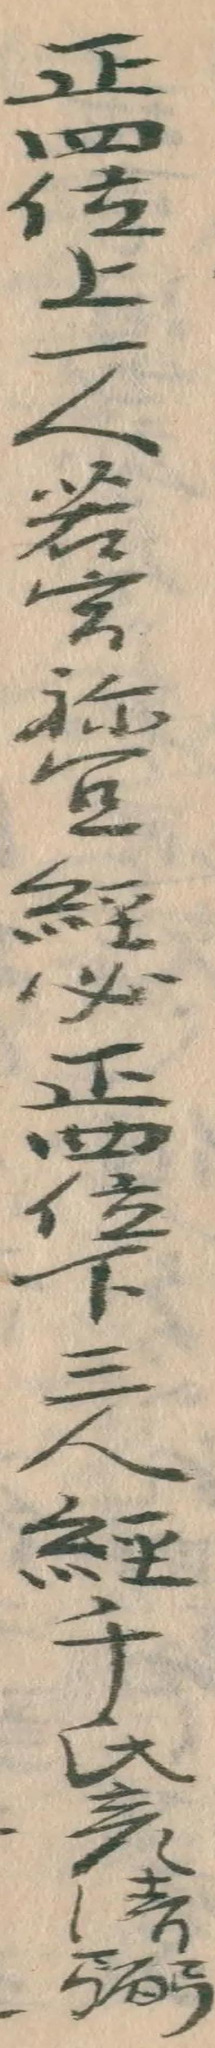正四位上一人若宮祢宜経必正四年下三人経千氏彦清弼
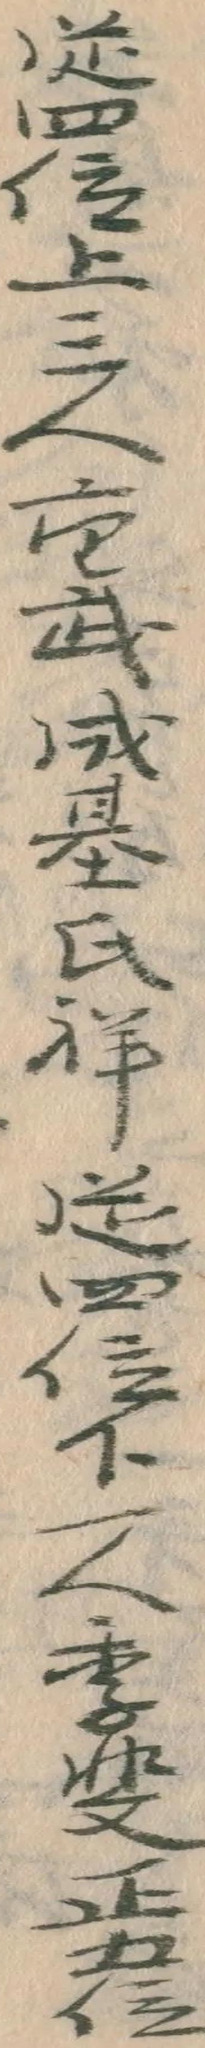従四位上三人重武成基氏祥従四位下一人季斐正五位
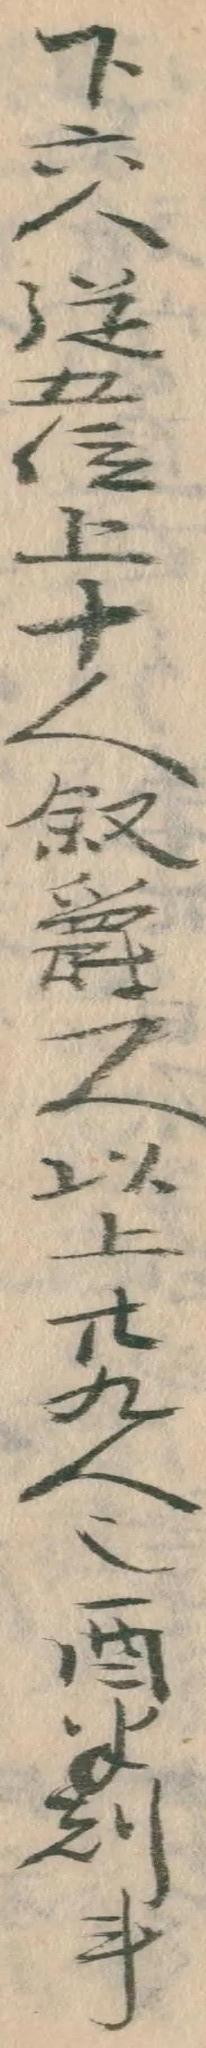下六人従五位上十人叙一人以上廿九人也酉半刻斗
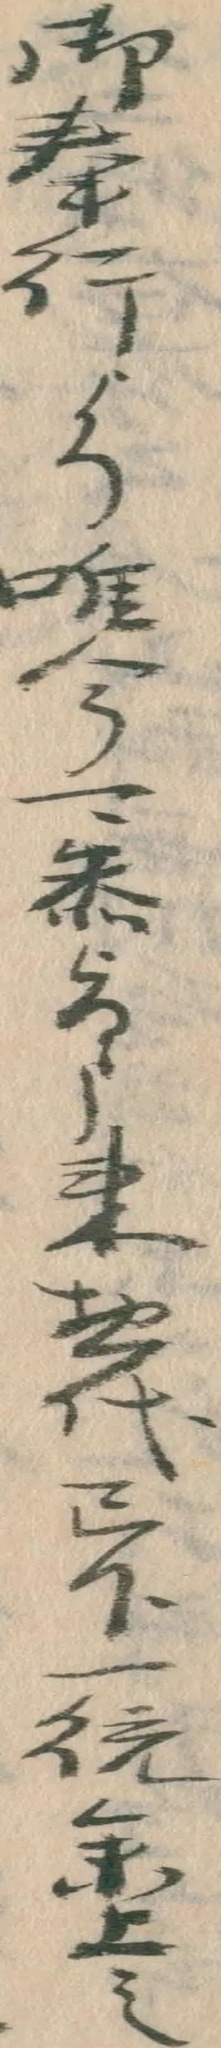御奉行より唯今可参旨申来惣代已下一統参上之
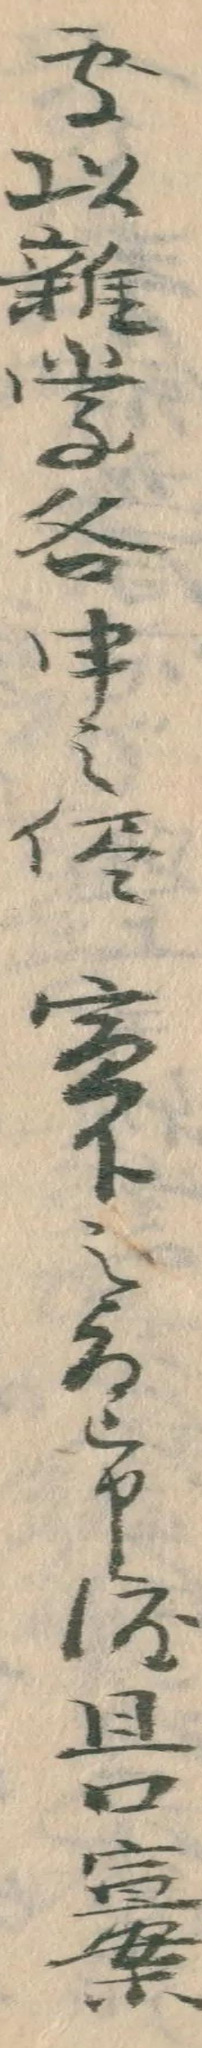處以雑掌各申之侭宣下之旨被申渡且口宣案
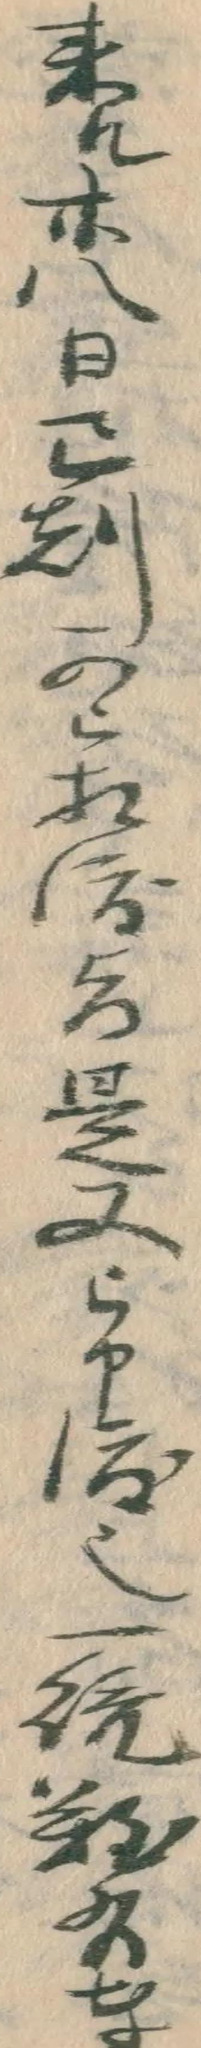来ル廿八日巳刻可被相渡旨是又被申渡也一統難有奉
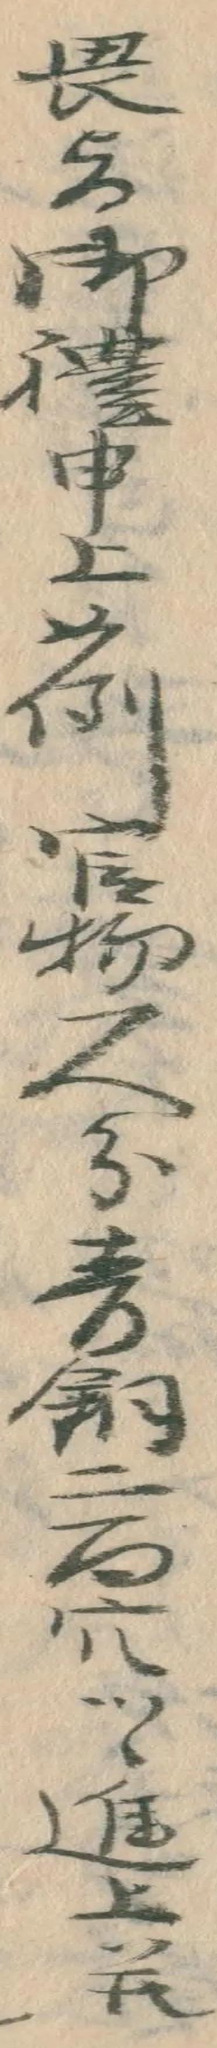畏旨御禮申上如例官物一人分青銅二百穴ツゝ進上并
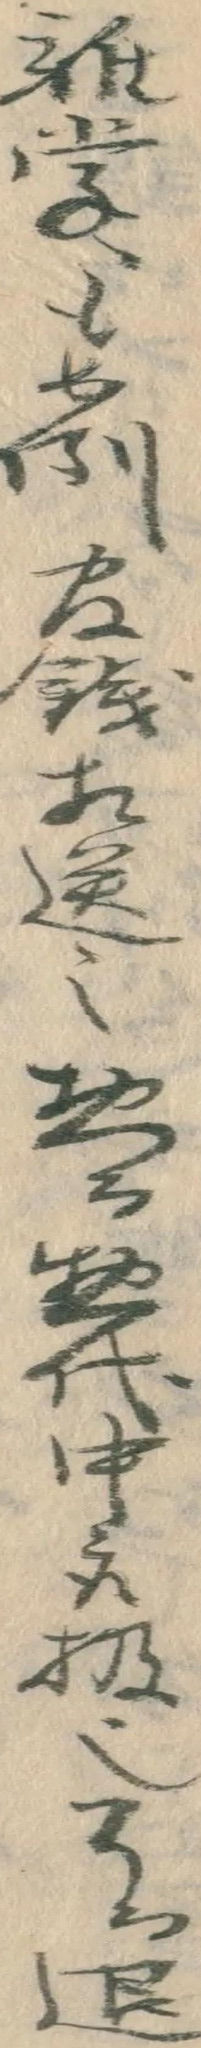雑掌へも如例官銭相送之惣而惣代中取扱也了而退
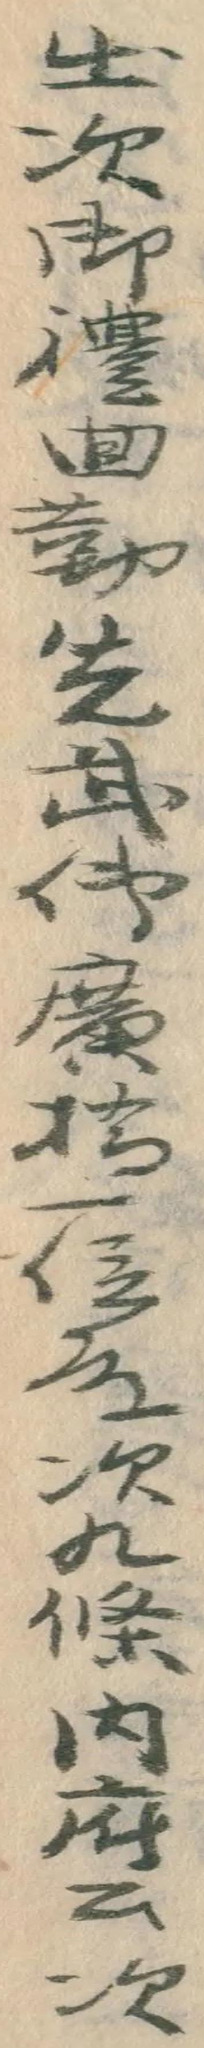出次御禮回勤先武傳廣橋一位故次九條内府公次

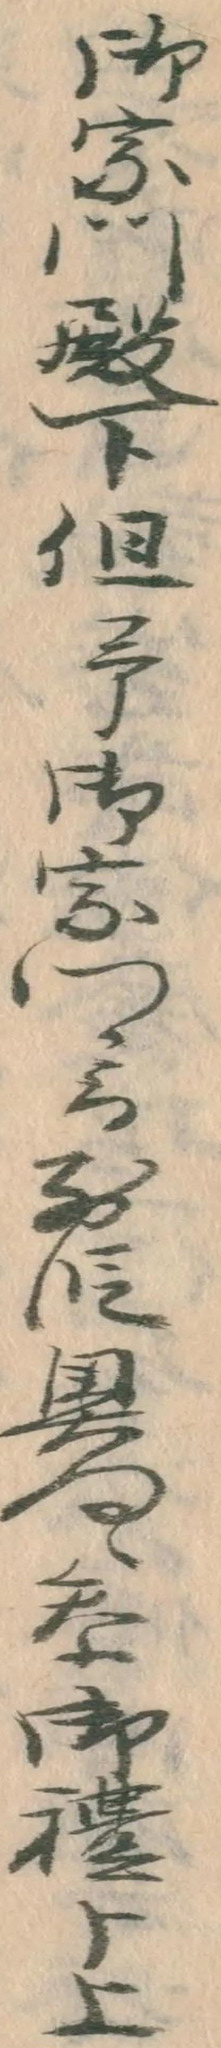御家門殿下但予御家門ニ而別段奥向へ参御禮申上
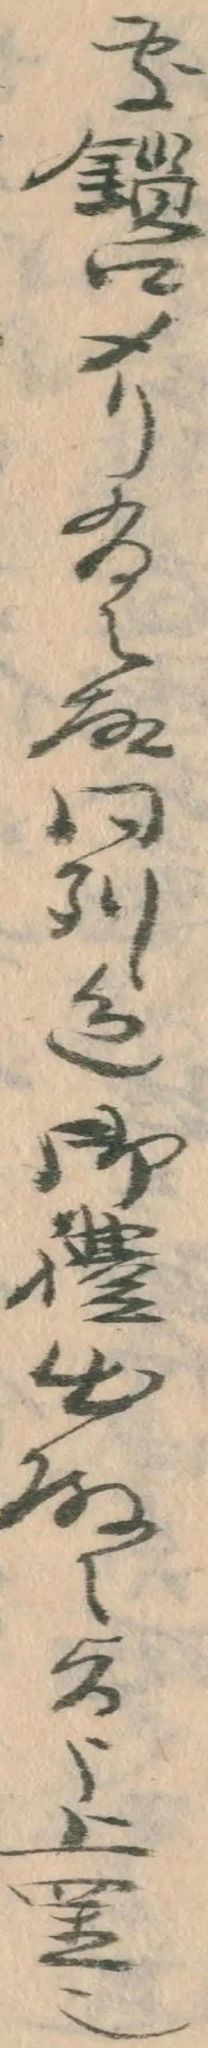處鎖口〆り有之故同刻過御禮出殿之旨申上置也
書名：賀茂社記録. 第63冊
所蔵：国立国会図書館 National Diet Library, JAPAN
